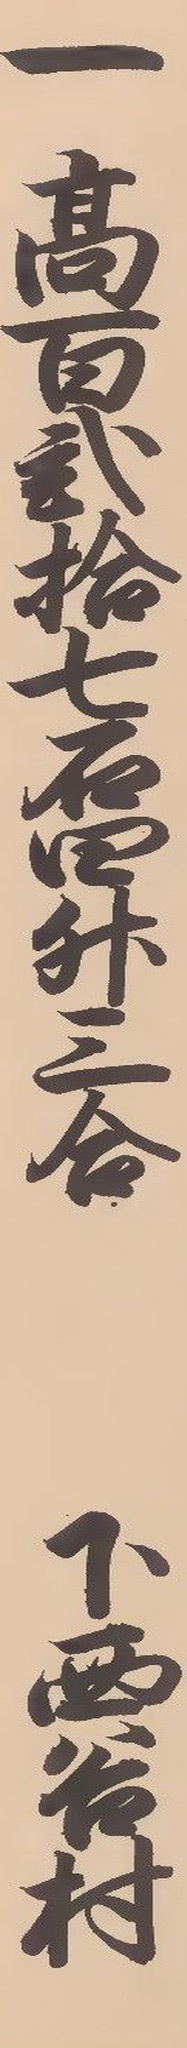一高百弐拾七石四升三合下西谷村
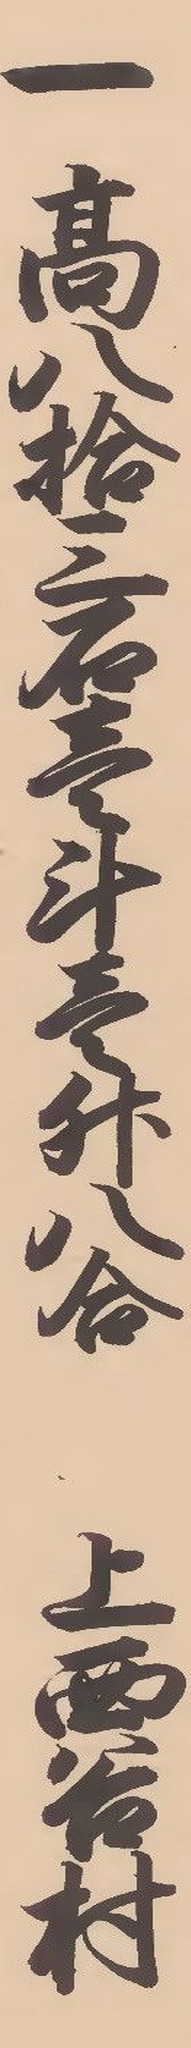一高八拾三石壱斗壱升八合上西谷村
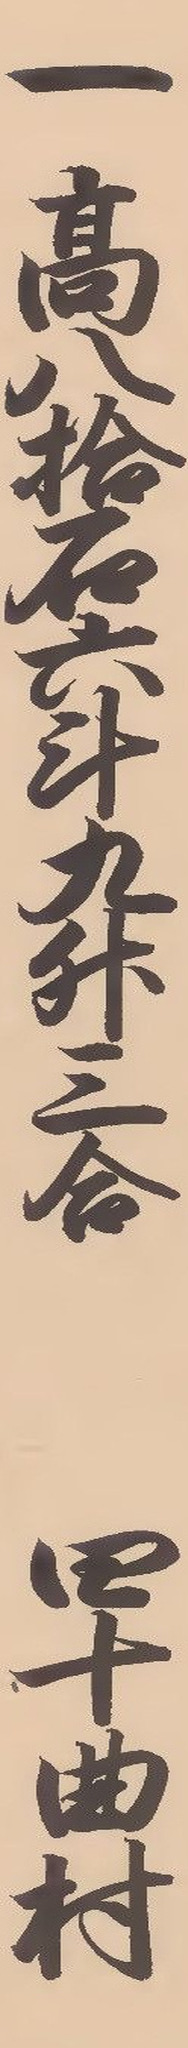一高八拾石六斗九升三合四十曲村

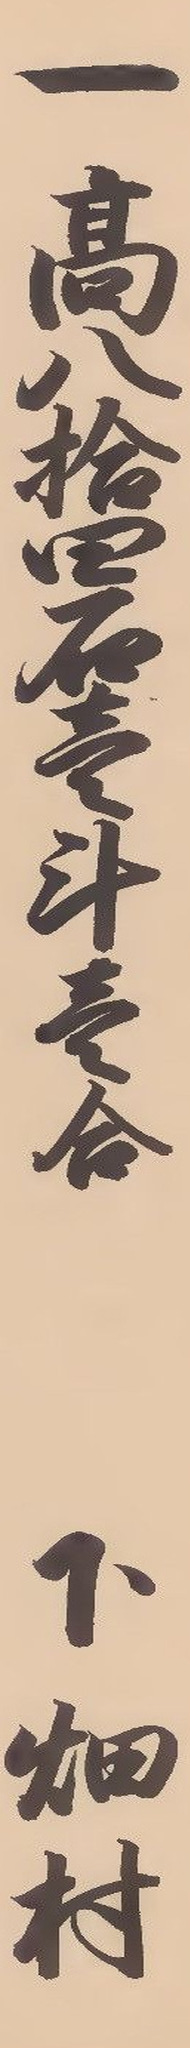一高八拾四石壱斗壱合下畑村
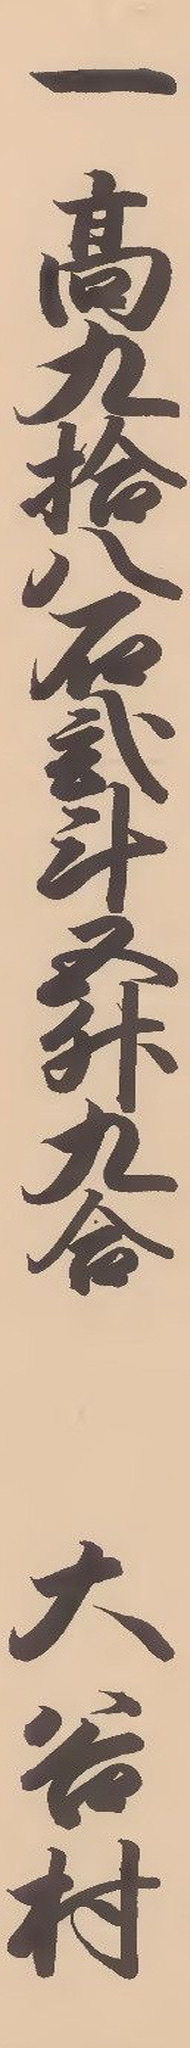一高九拾八石弐斗五升九合大谷村
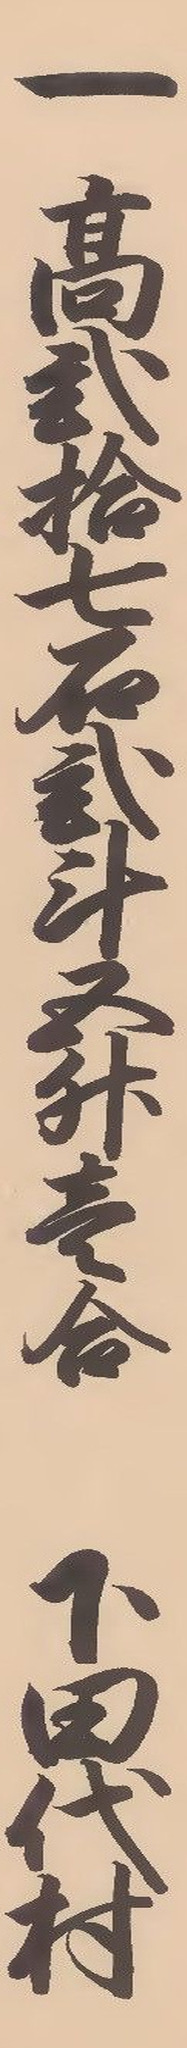一高弐拾七石弐斗五升壱合下田代村
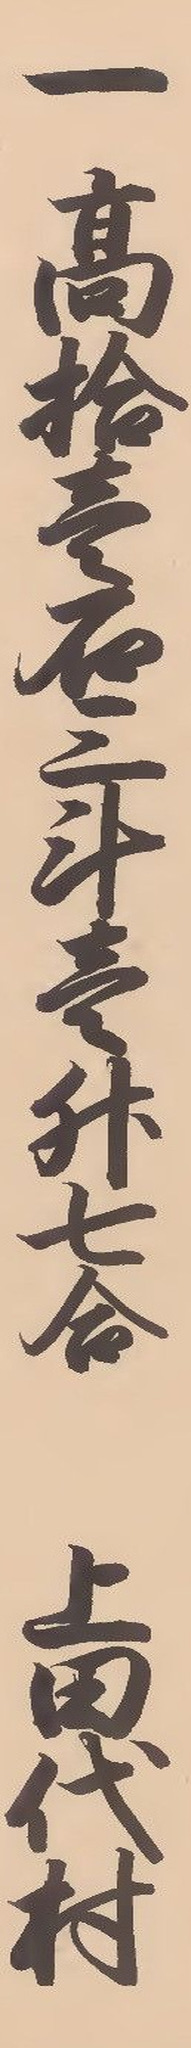一高拾壱石三斗壱升七合上田代村
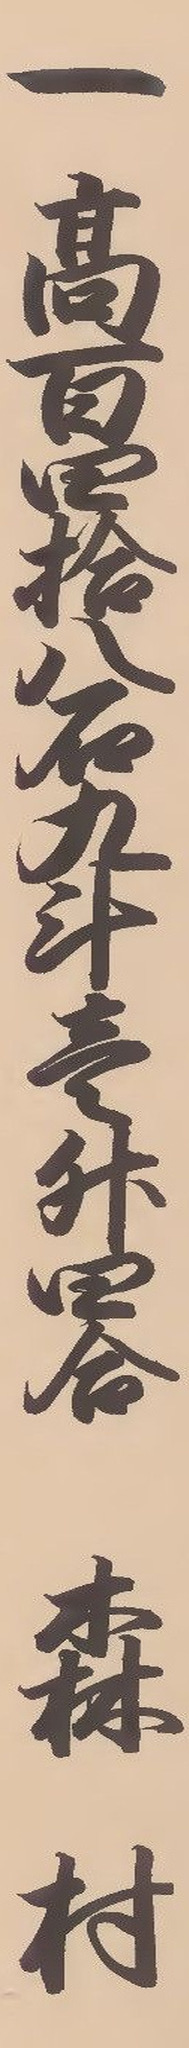一高百四拾八石九斗壱升四合森村
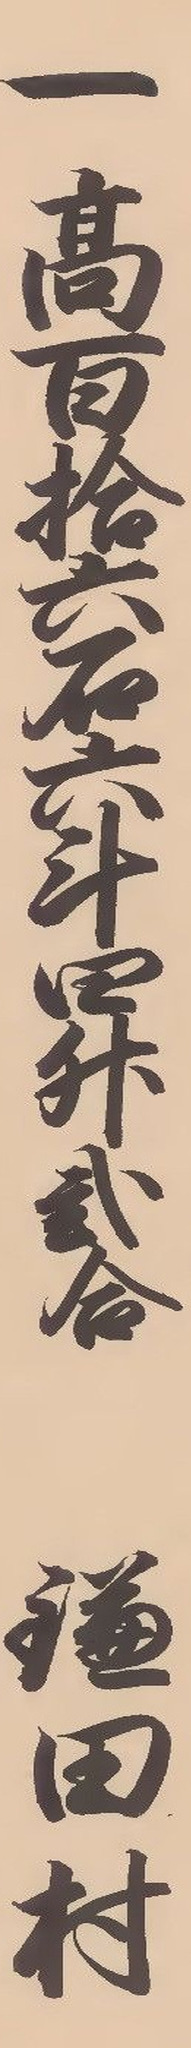一高百拾六石六斗四升弐合鎌田村
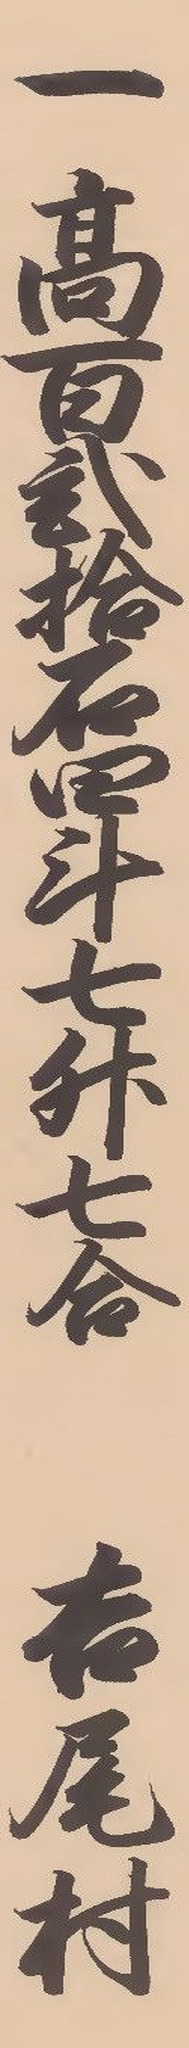一高百弐拾石四斗七升七合吉尾村
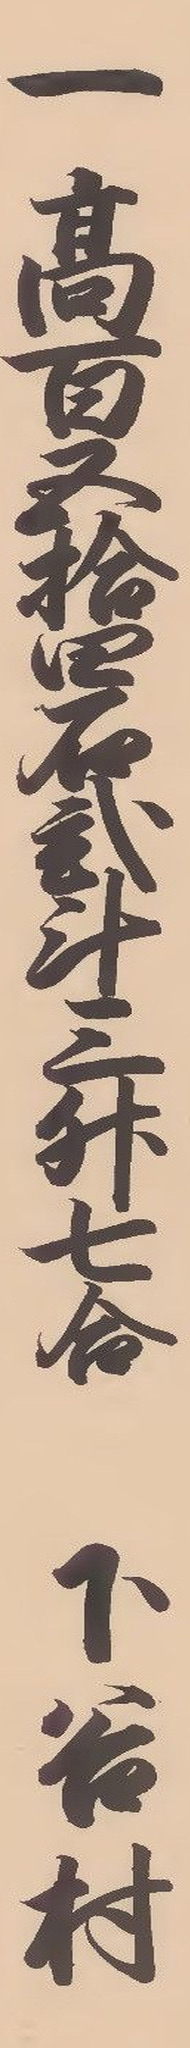一高百五拾四石弐斗三升七合下谷村

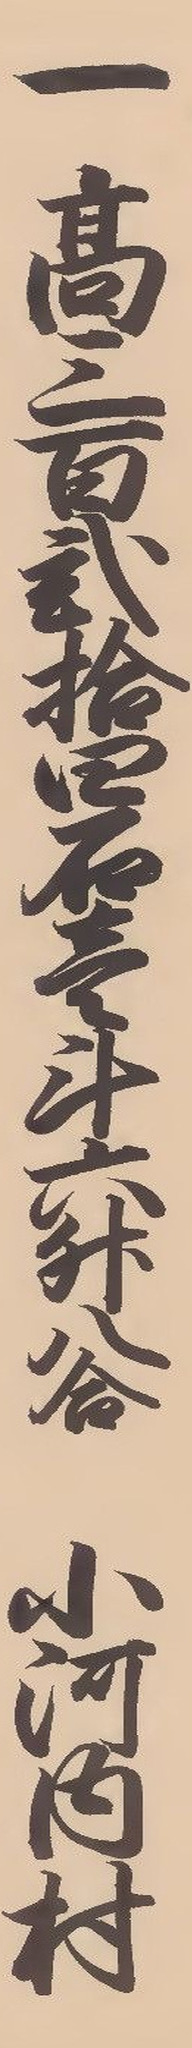一高三百弐拾四石壱斗六升八合小河内村
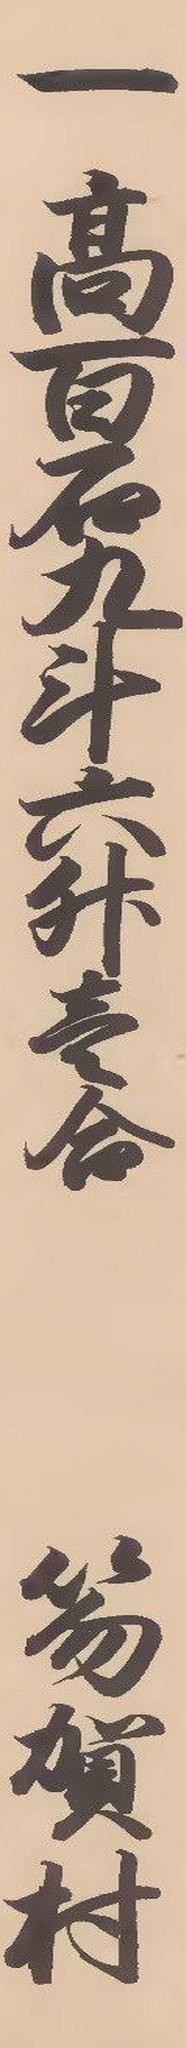一高百石九斗六升壱合笏賀村
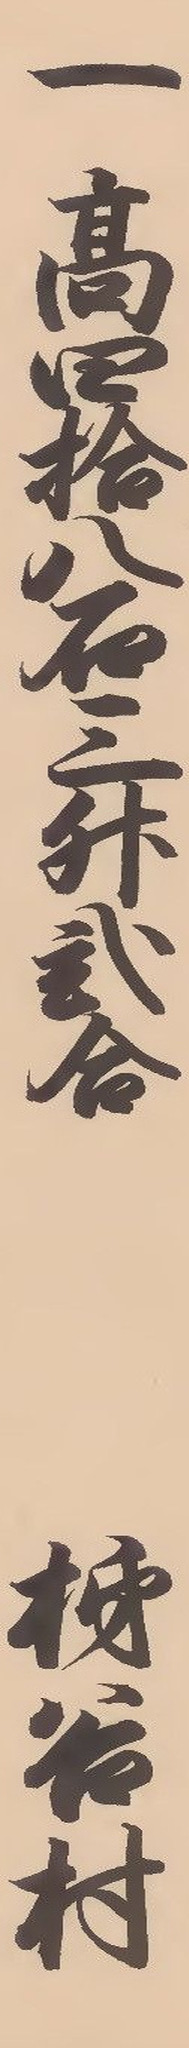一高四拾八石三升弐合柿谷村
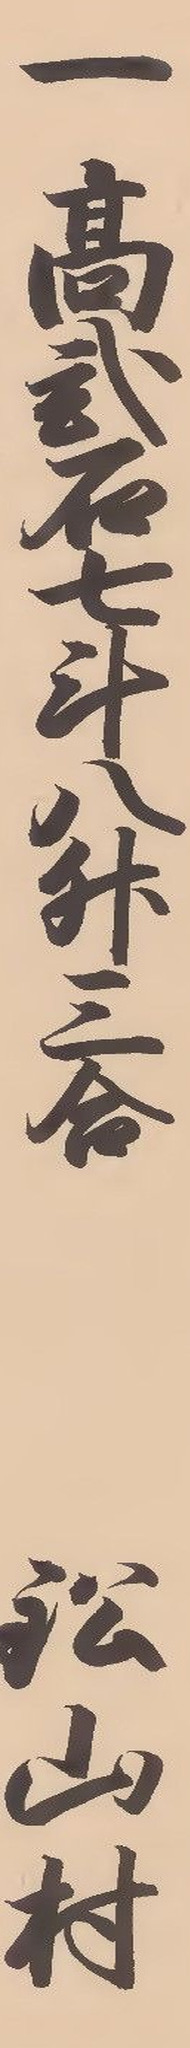一高弐石七斗八升三合鉛山村
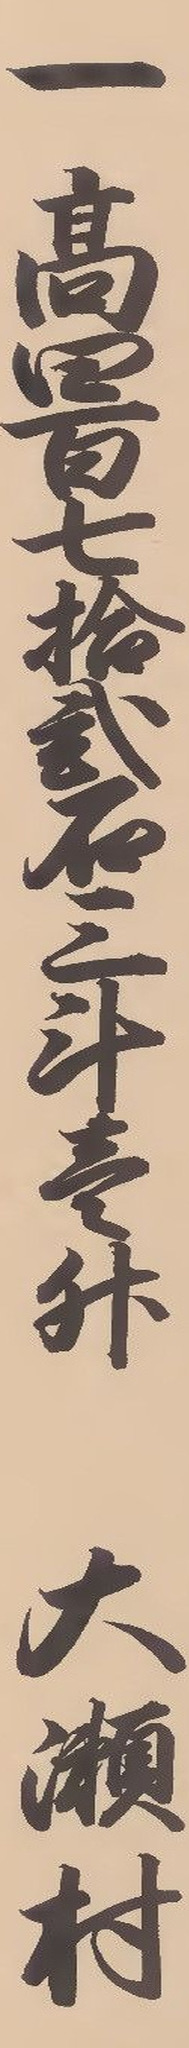一高四百七拾弐石三斗壱升大瀬村
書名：伯耆国郷帳
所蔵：国立公文書館 National Archives of Japan
